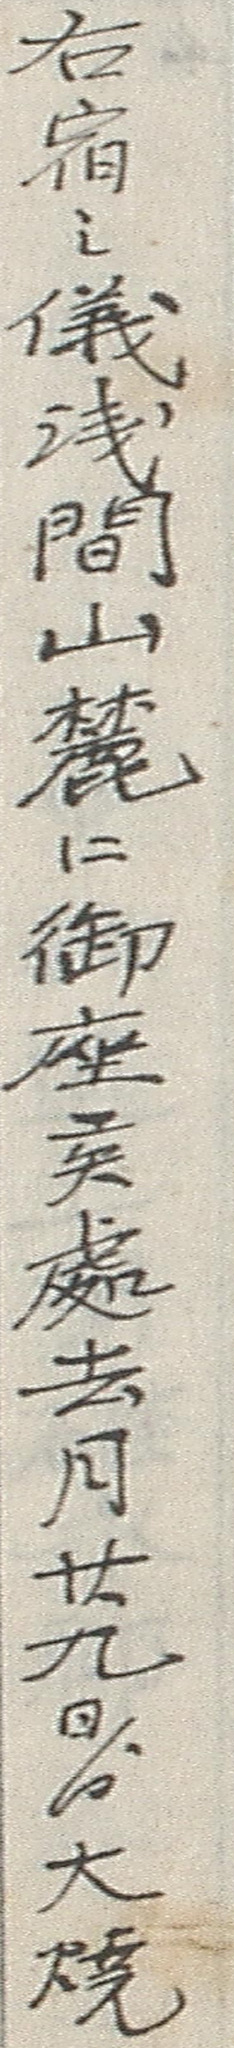右宿之儀浅間山麓に御座候處去月廿九日ゟ大焼
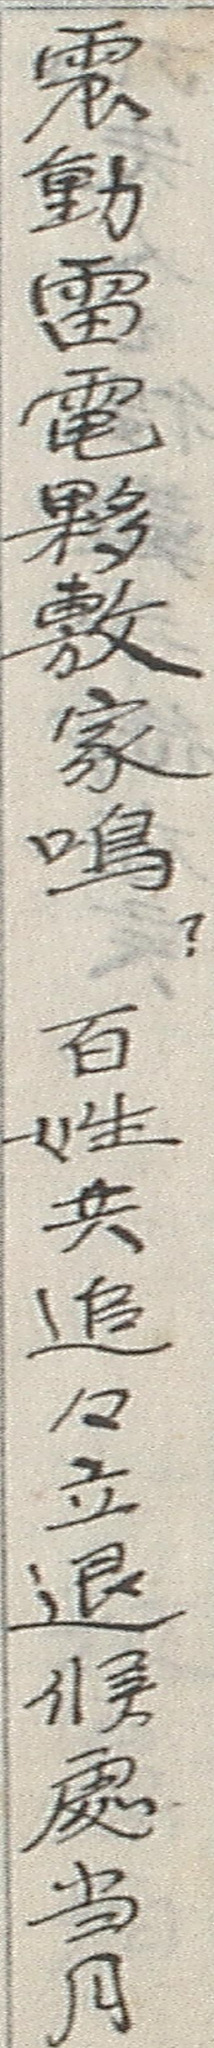震動雷電夥敷家鳴？百姓共追々立退候處当月
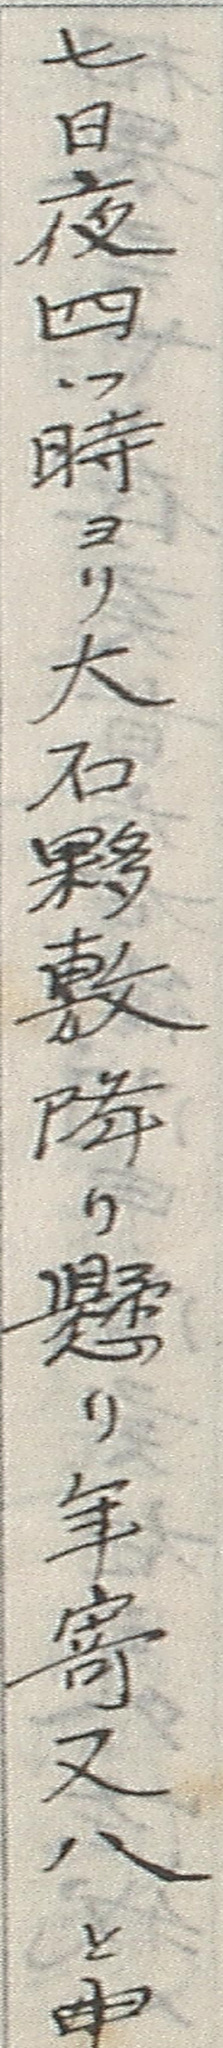七日夜四ツ時ヨリ大石夥敷降り懸り年寄又八と申
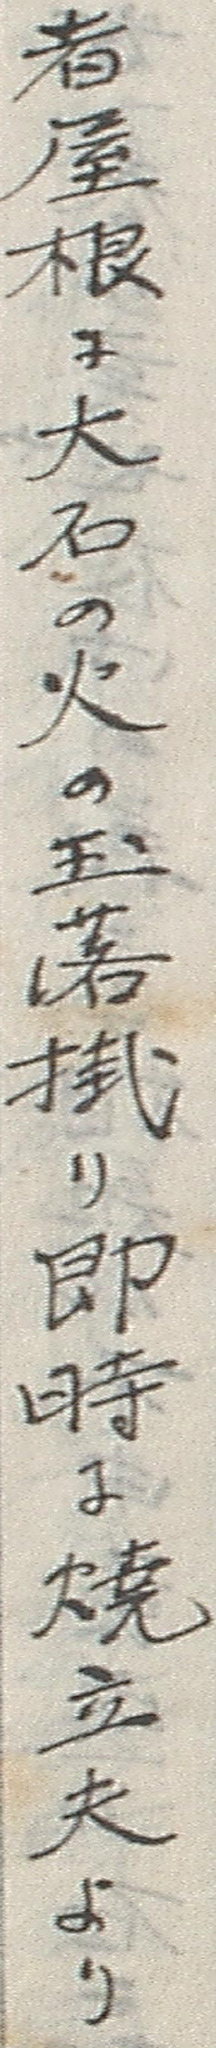者屋根に大石の火の玉落掛り即時に焼立夫より
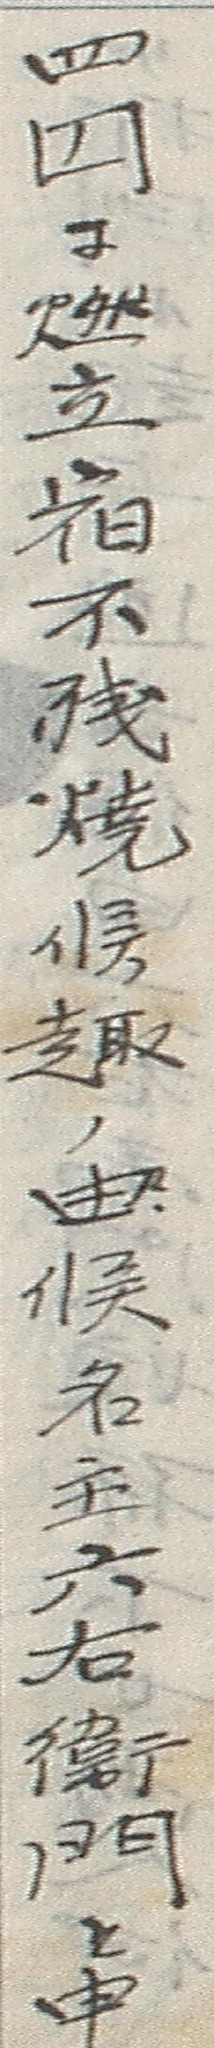四円に燃立宿不残焼候趣の由候名主六右衛門と申
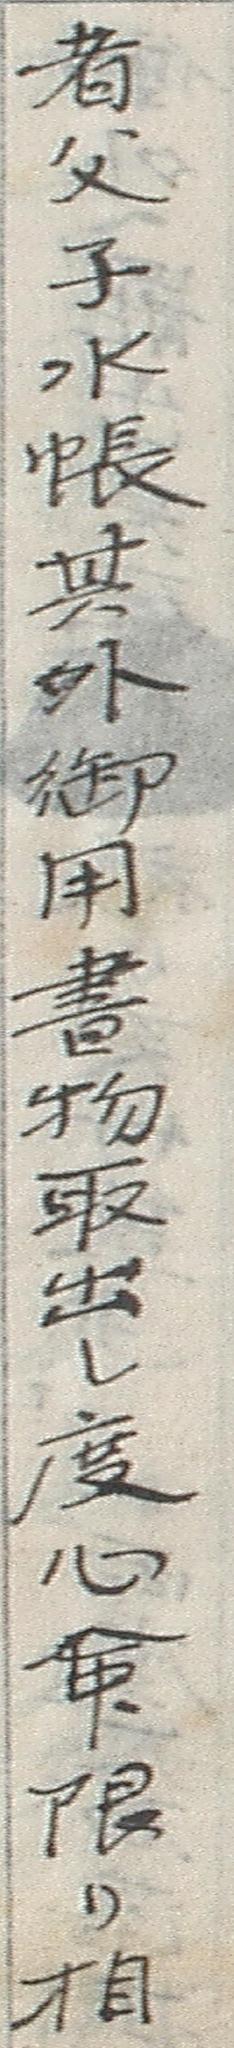者父子水帳其外御用書物取出し度心命限り相

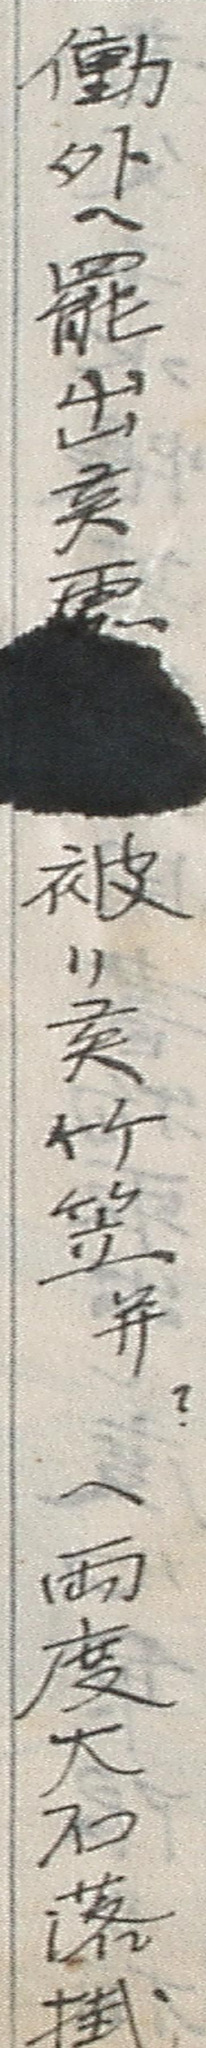働外へ罷出候被り候竹笠并？へ両度大石落掛
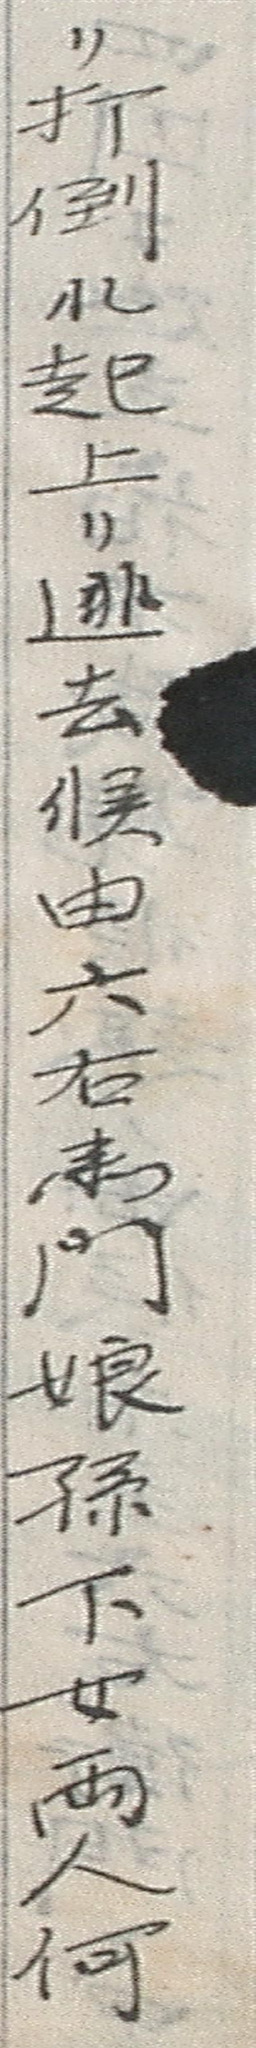り打倒起上り逃去候由六右衛門娘孫下女両人何
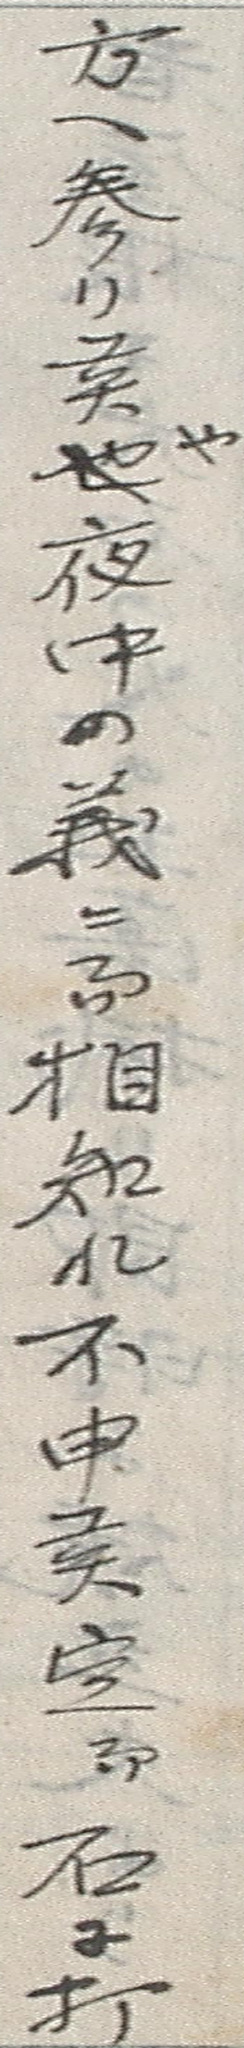方へ参り候や夜中の義ニ而相知れ不申候定而右ニ打
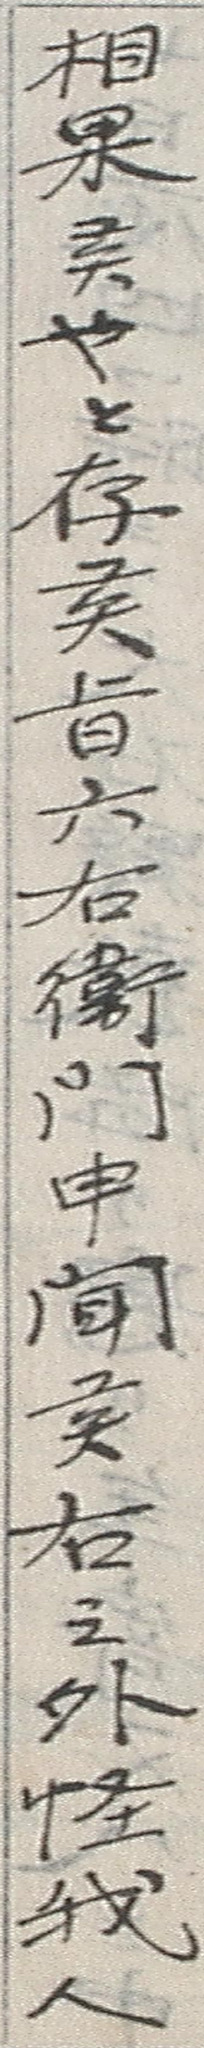相果候やと存候旨六右衛門申聞候右之外怪我人
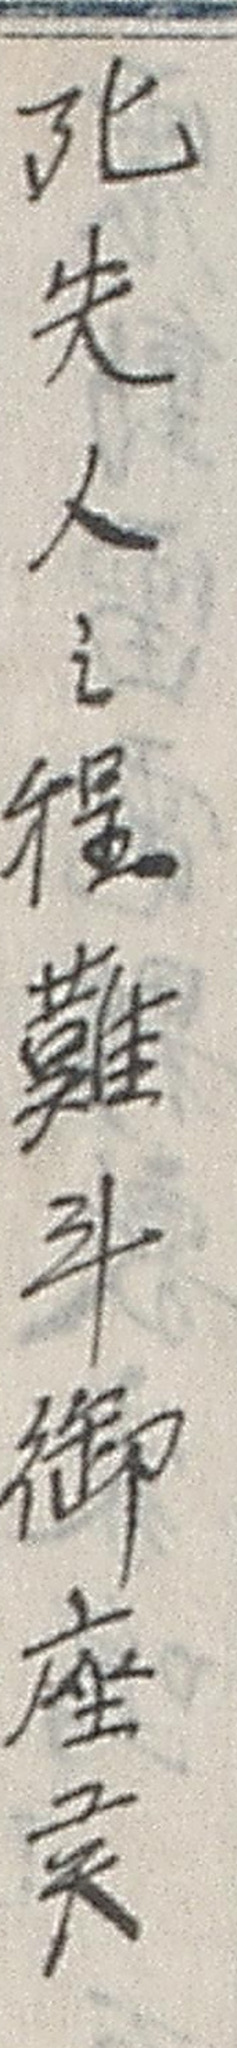死失人之程難計御座候
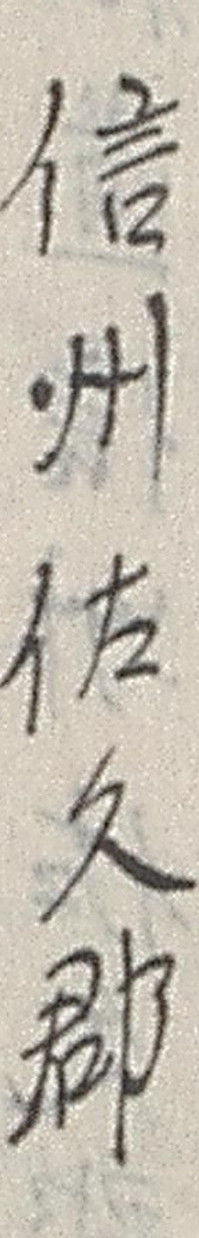信州佐久郡
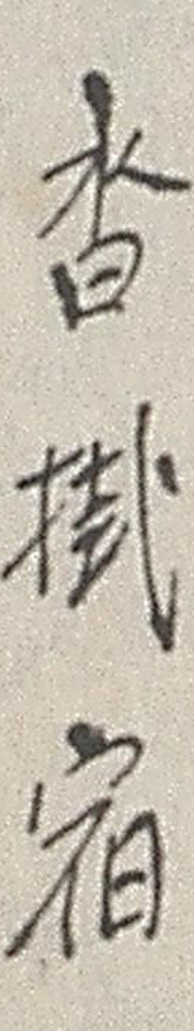沓掛宿
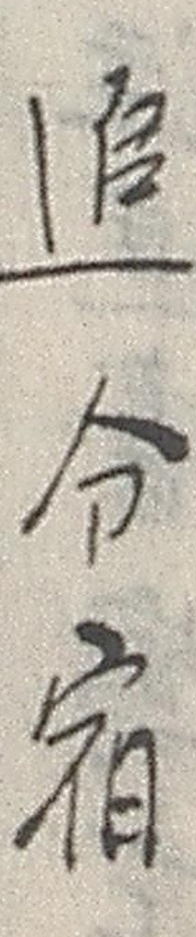追分宿
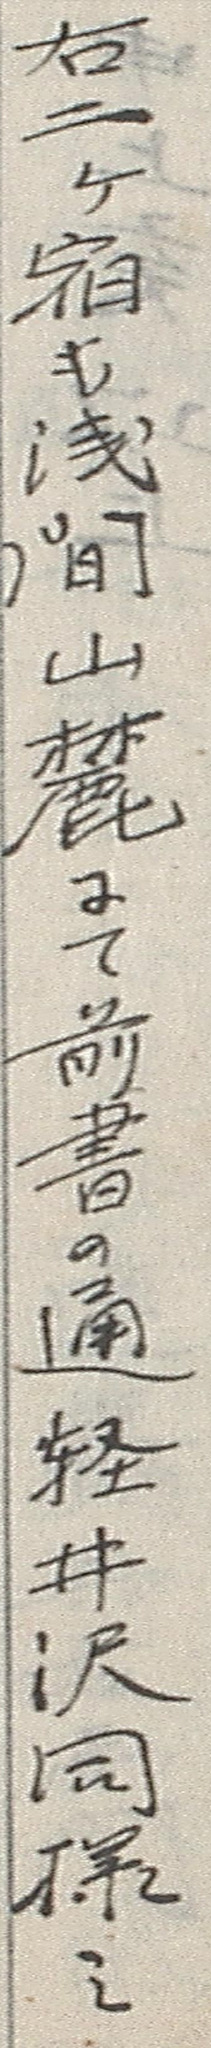右二ヶ宿も浅間山麓にて前書の通軽井沢同様之
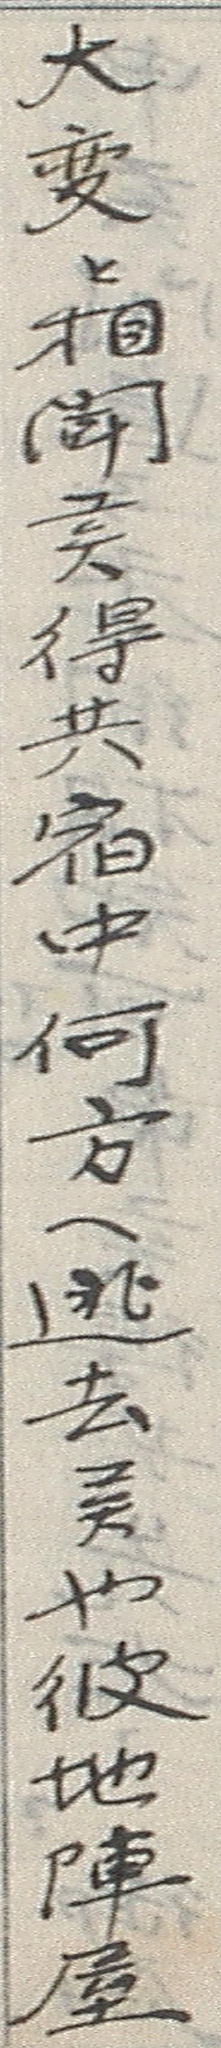大変と相聞候得共宿中何方へ逃去候也彼地陣屋
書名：浅間山焼出記
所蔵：東京大学地震研究所図書室 Earthquake Research Institute Library, The University of Tokyo, JAPAN
